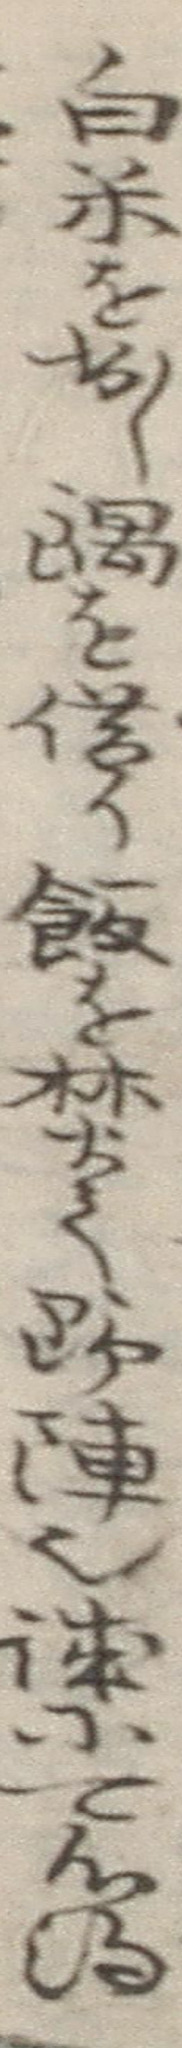白米を出し鍋を借り飯を焚て野陣也誠に可心得
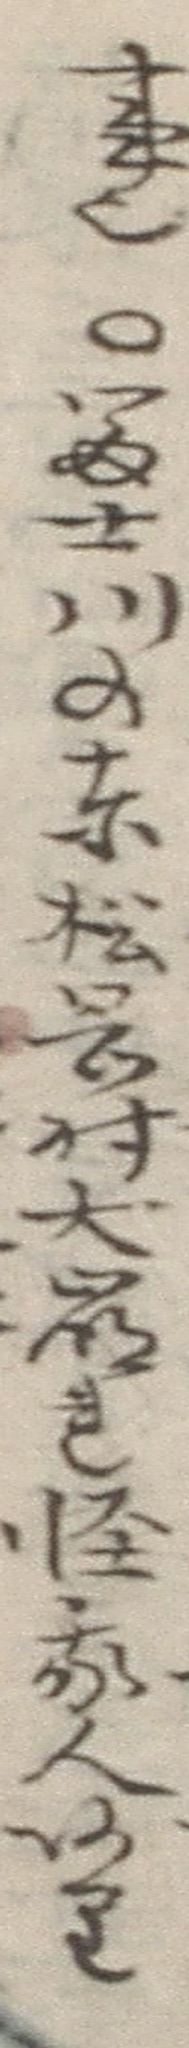事也○富士川の東松岡村大崩れ怪我人あり
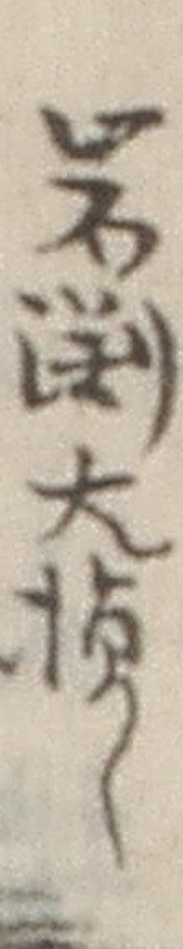岩渕大損し
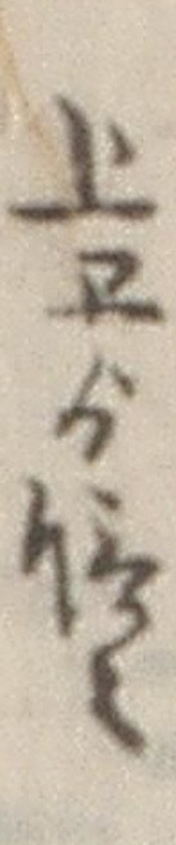上ヱゟ段々
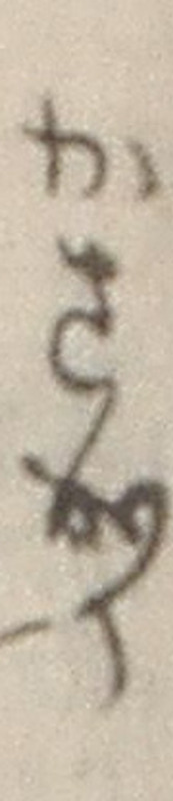かさ成り
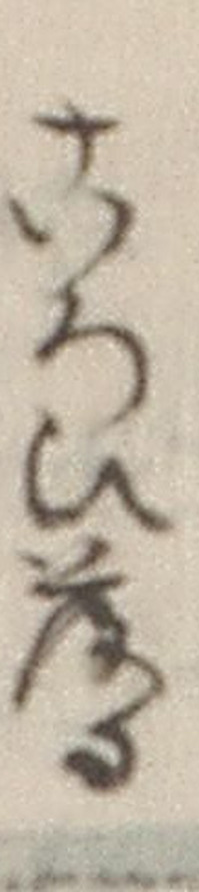ころひ落る
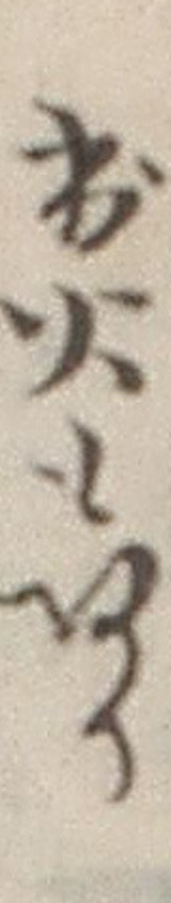出火もあり
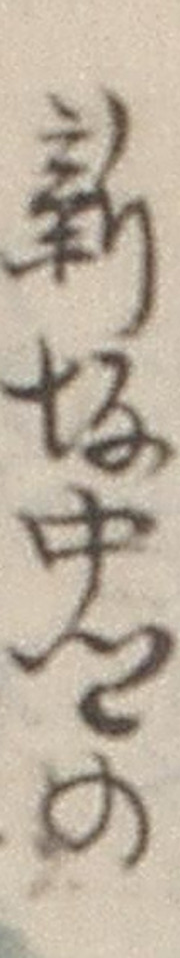新坂中郷の
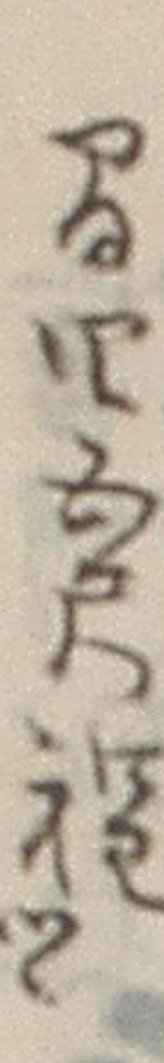間四五尺程ツヽ
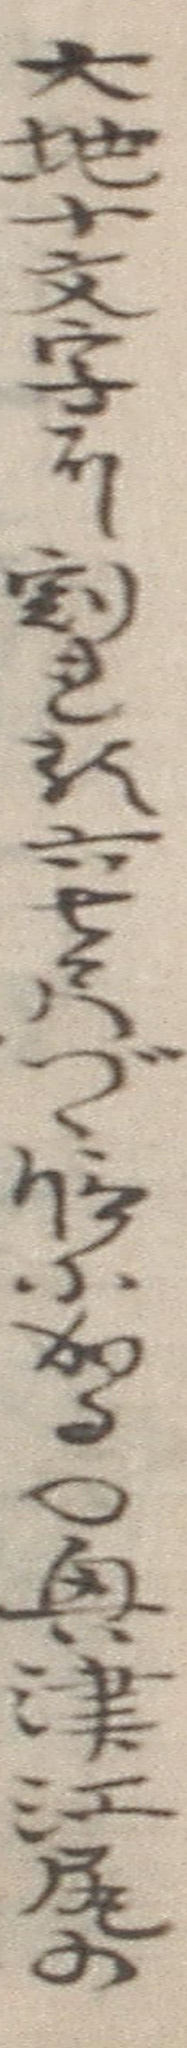大地十文字に割れる六七尺づゝ段に成る○興津江尻の
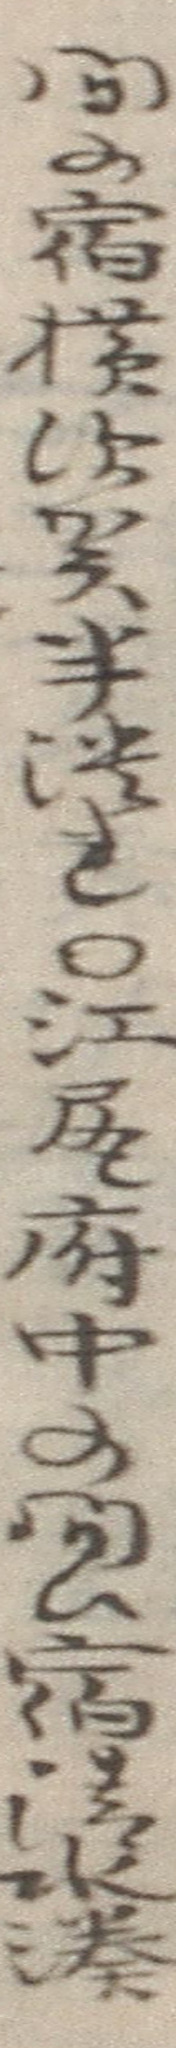間の宿横須賀半潰れ○江尻府中の間ひ宿清水湊
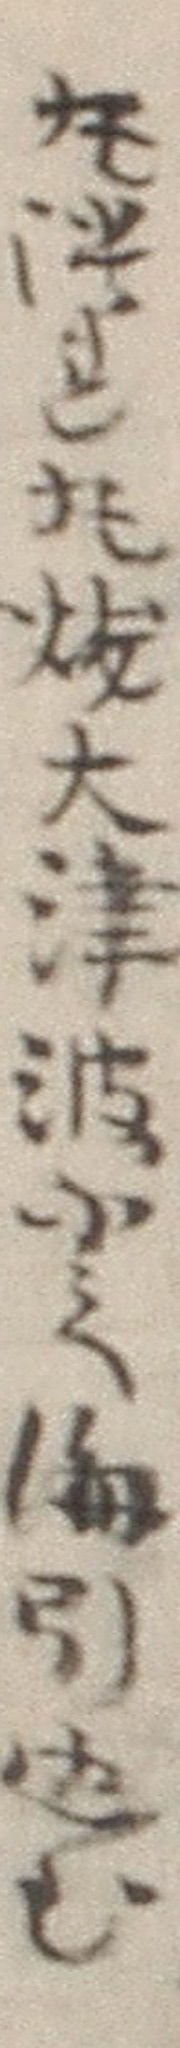丸潰れ丸焼大津波にて海引込む
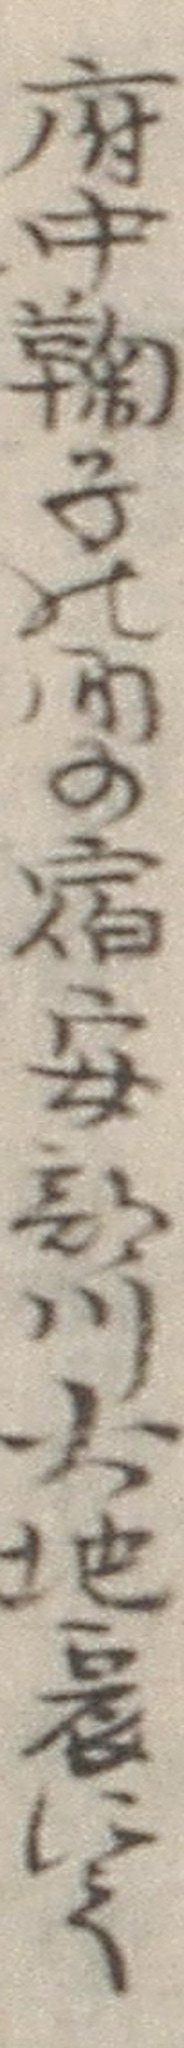府中鞠子の間の宿安部川大地震にて
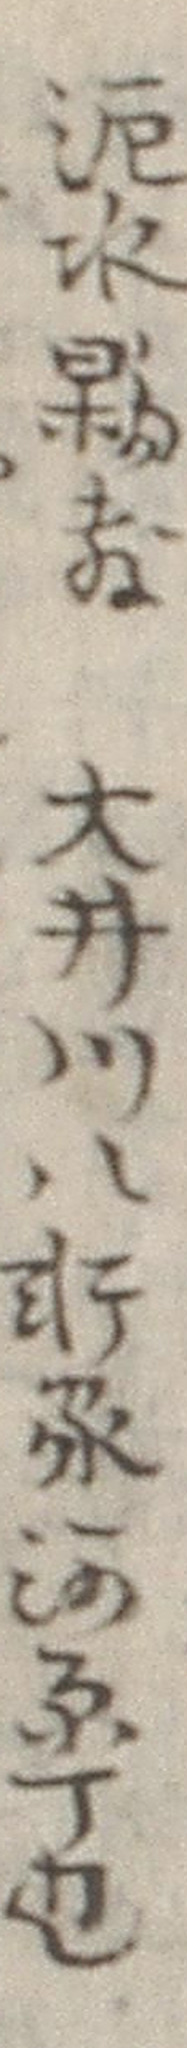泥水夥敷大井川八軒家河原丁辺
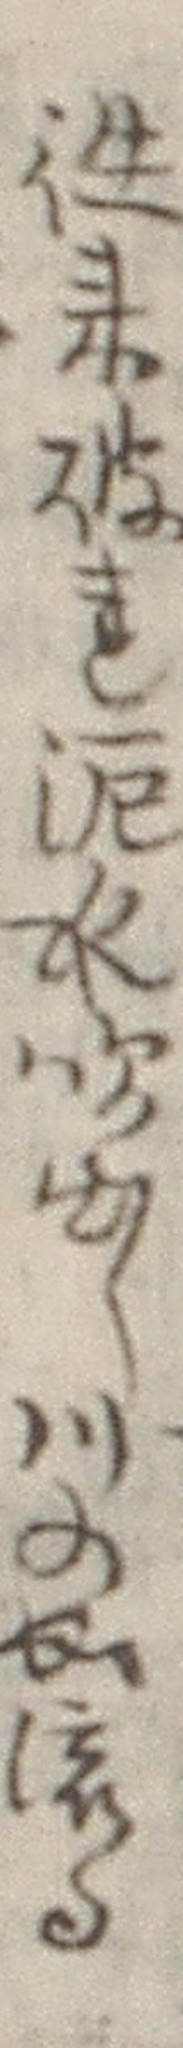往来破れ泥水吹出し川の如流る
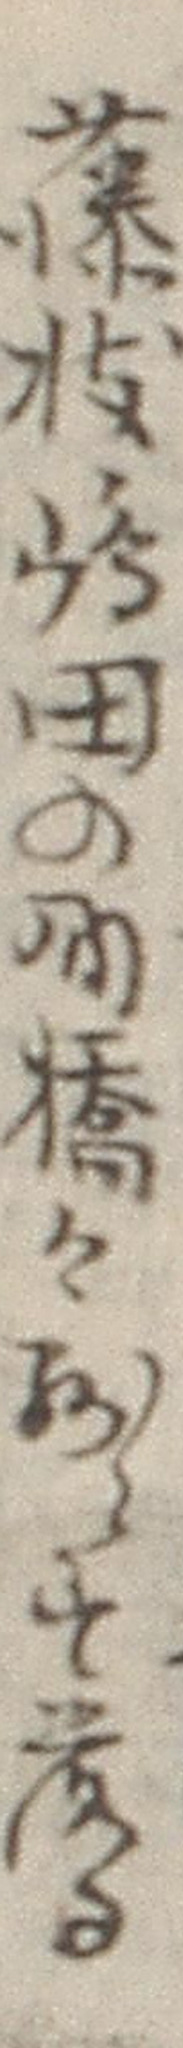藤枝島田の間橋々残らす落る
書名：諸國大地震年代記末代噺種
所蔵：東京大学地震研究所図書室 Earthquake Research Institute Library, The University of Tokyo, JAPAN
